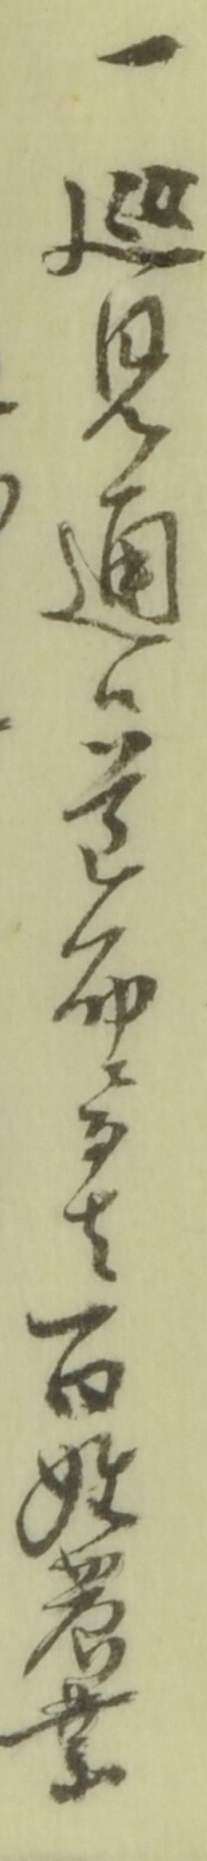一巡見通候道筋二而者百姓農業
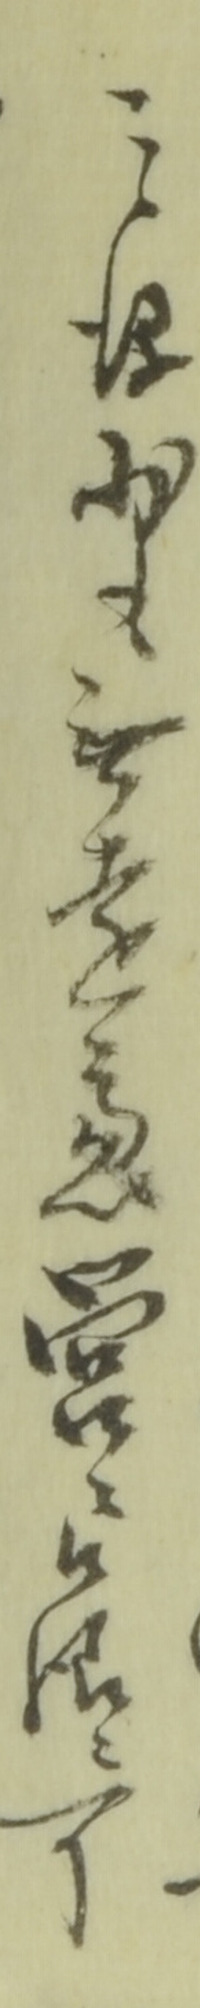之様少も無遠慮営二候様二可

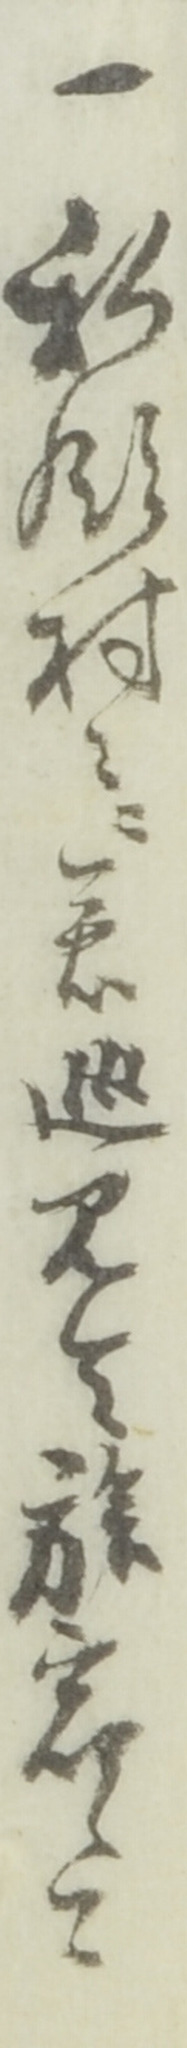一私領村々二若巡見令旅宿候て
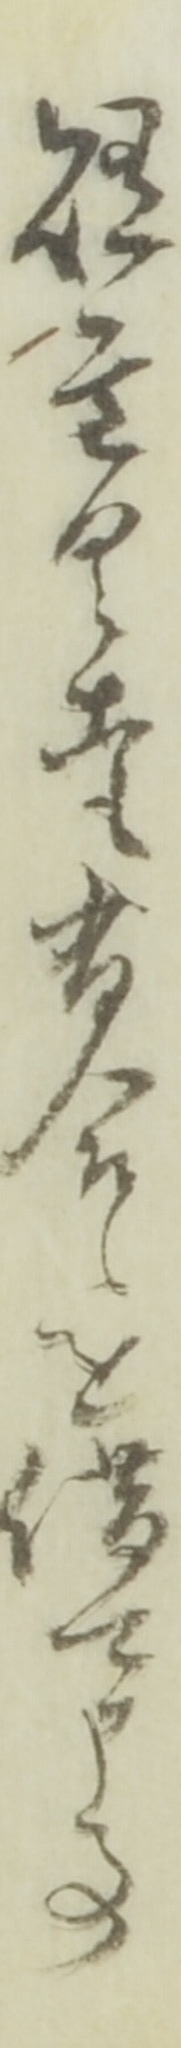賄道具等も書合い候を借可申事
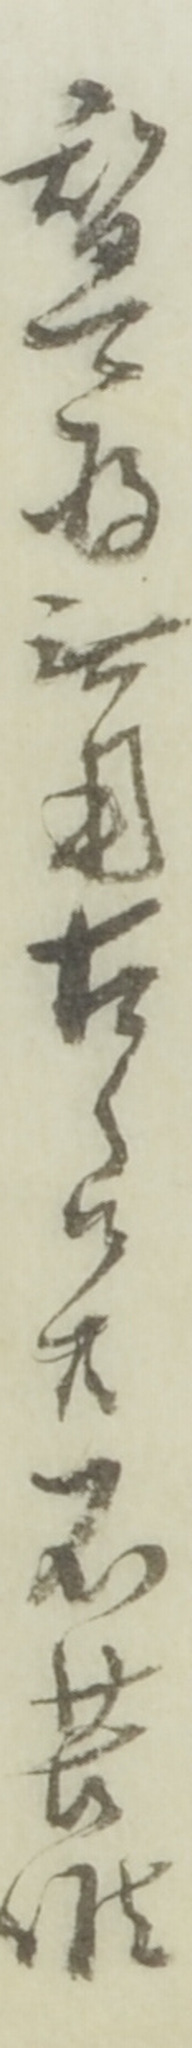替可為無用古之候共不芳候
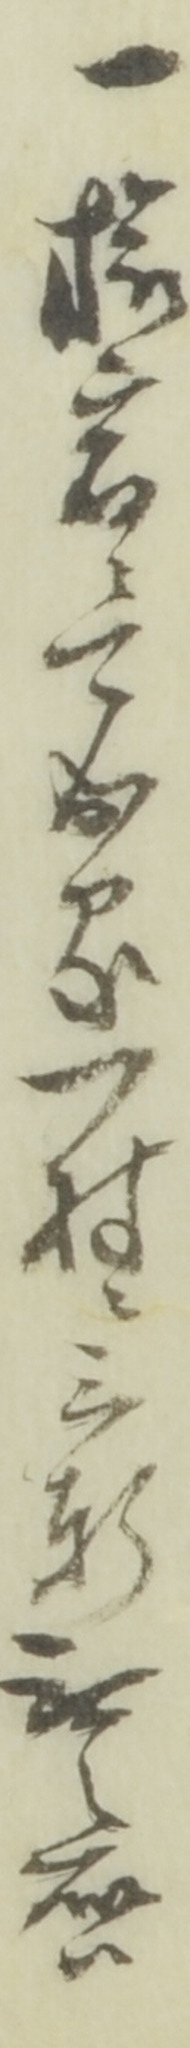一旅宿二可成家一村二三軒無之所ハ
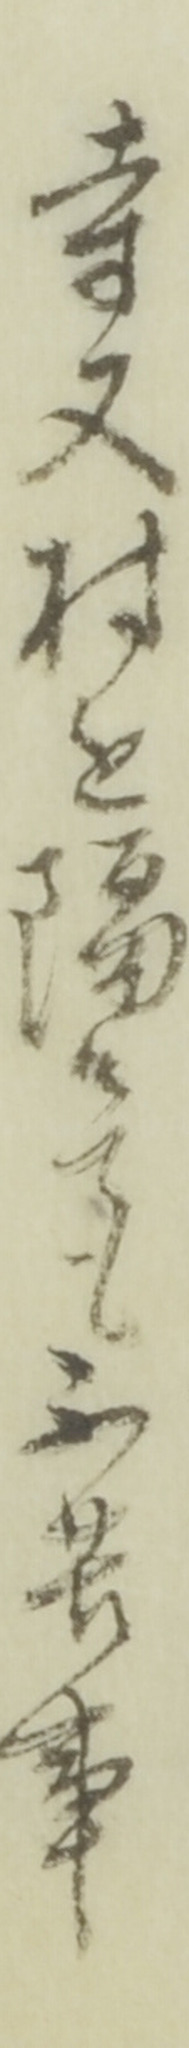寺又村を隔候ても不芳事
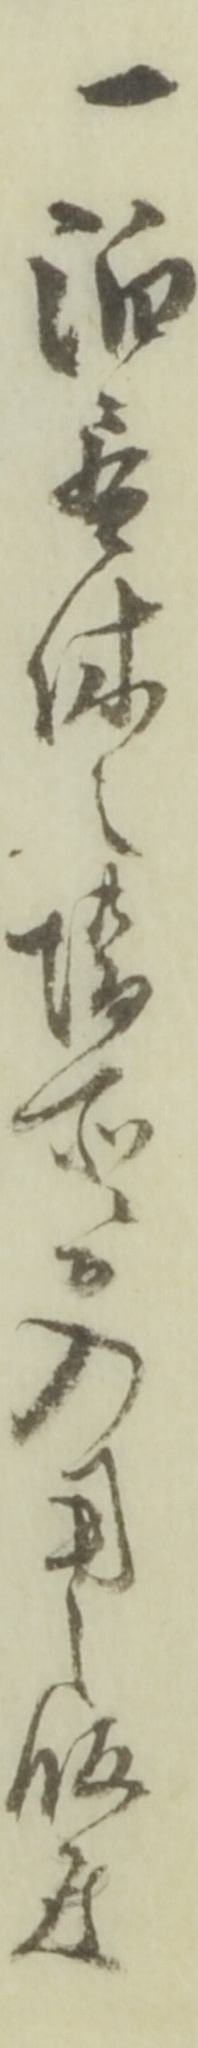一泊並休之場所二而入用之飯米
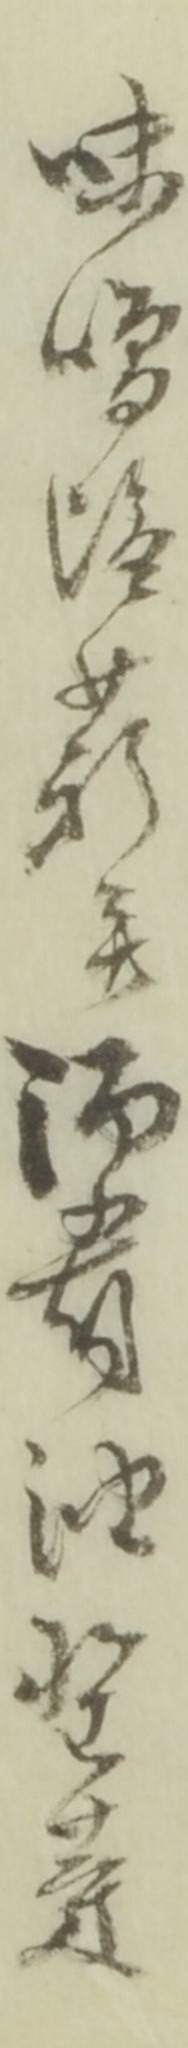味噌塩薪並酒肴油野菜
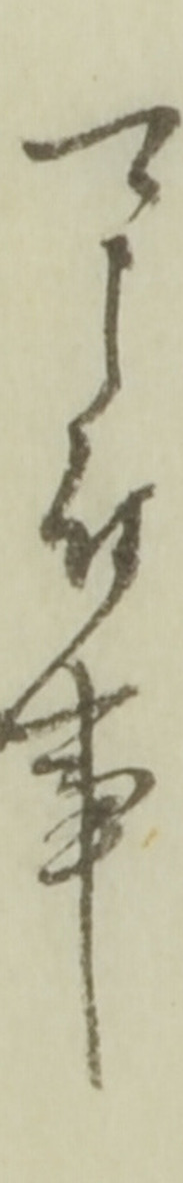可申付事
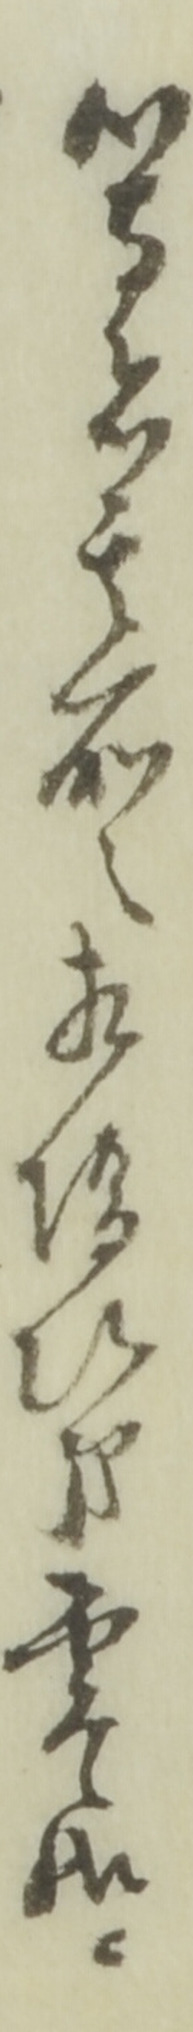等者其前之相増次第売候様二
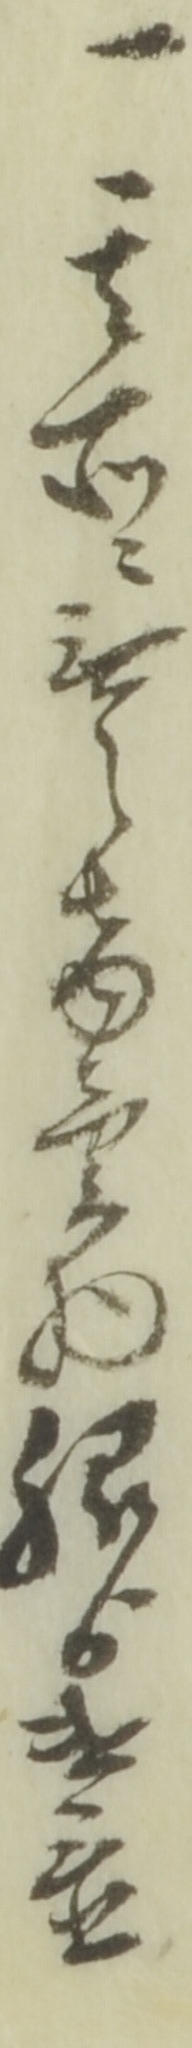一其所二無之商売物銀より遣置
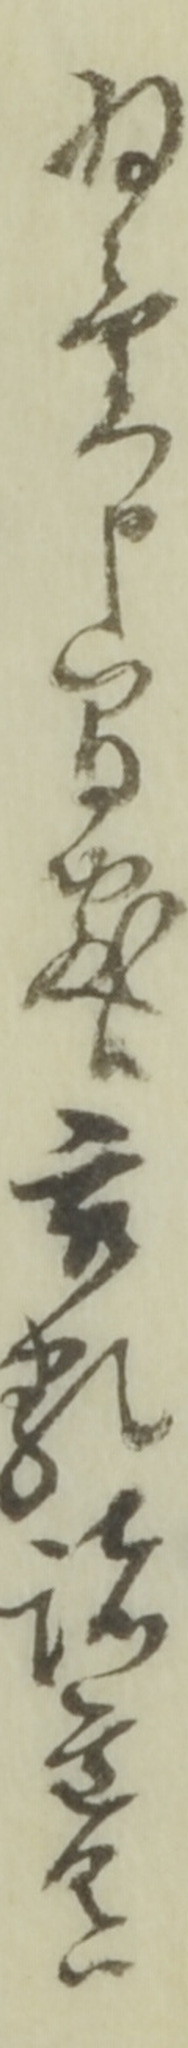為売申間敷候衣類諸道具ハ
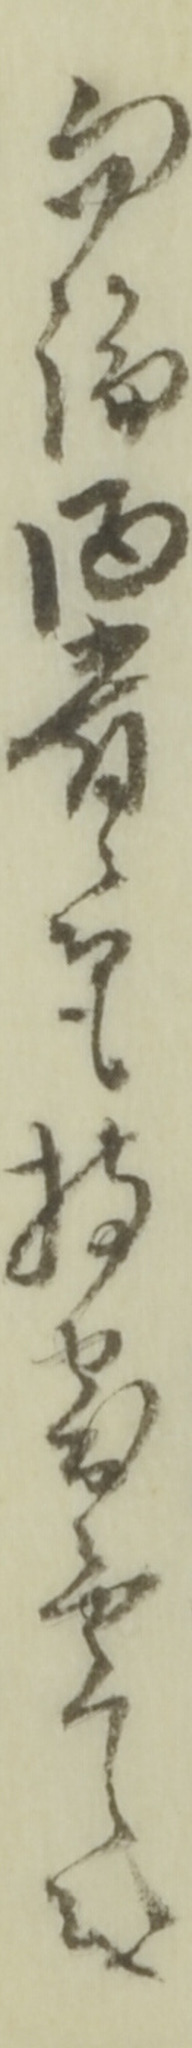勿論酒肴候而も持寄売候義
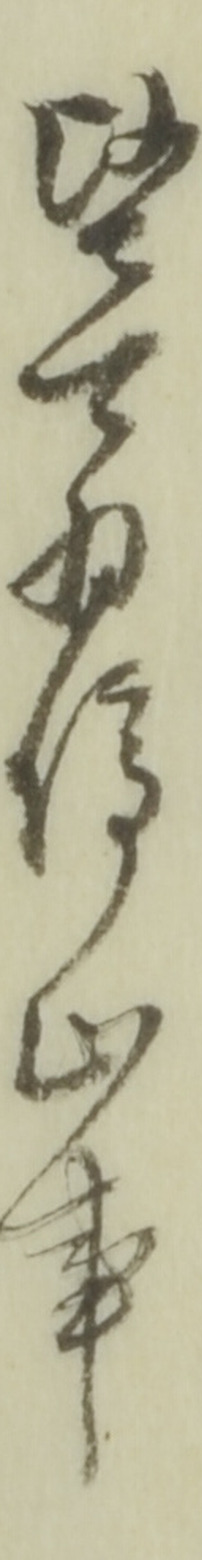堅可多為停止事
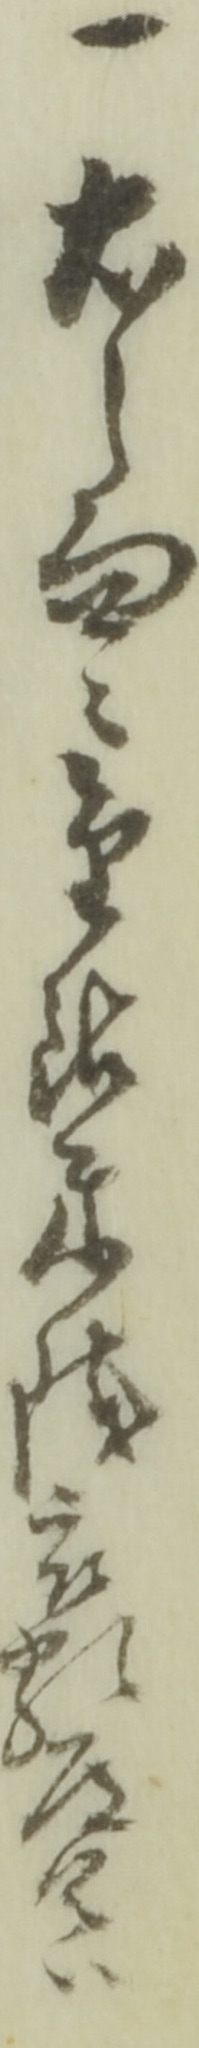一右之面々金銀米銭衣類差出ハ
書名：御公儀様御領主様御触書控
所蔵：伊那市立高遠町図書館・合同会社AMANE
